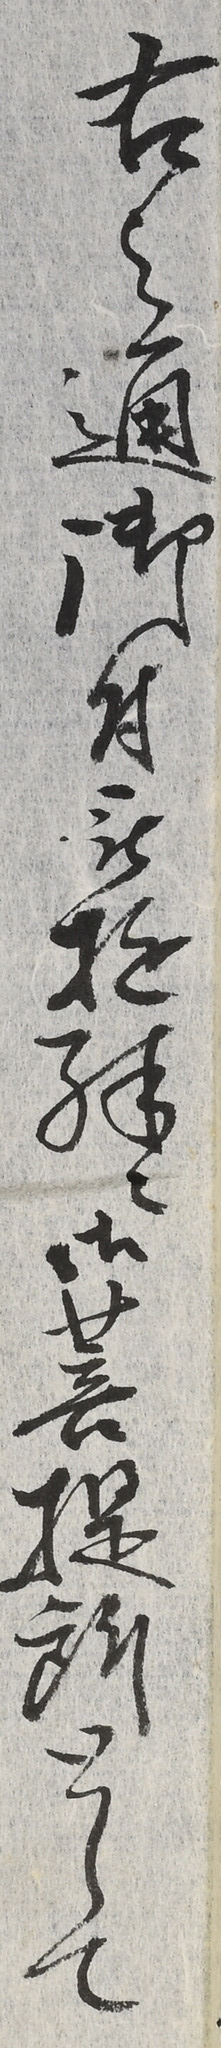右之通御付被遊殊ニ御菩提所として
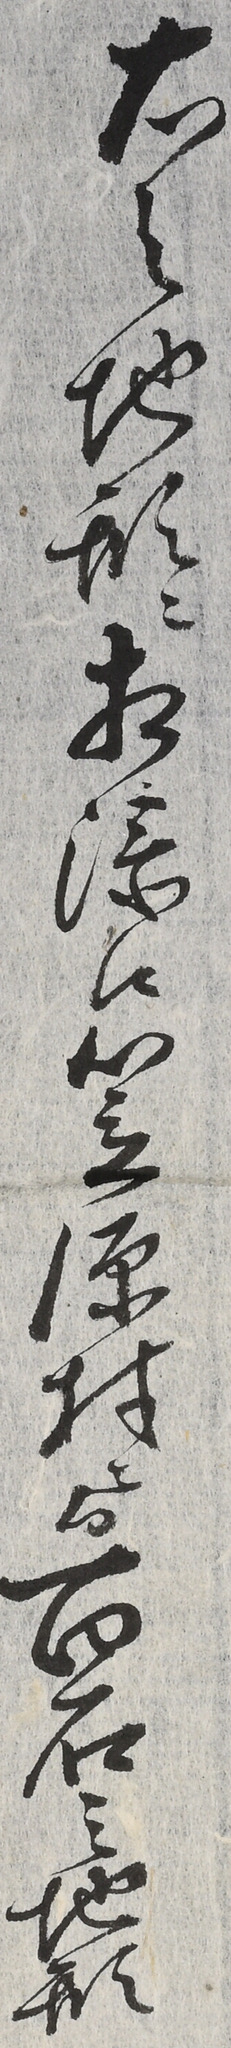右之地形ニ相添候笠源村ニ而百石之地形
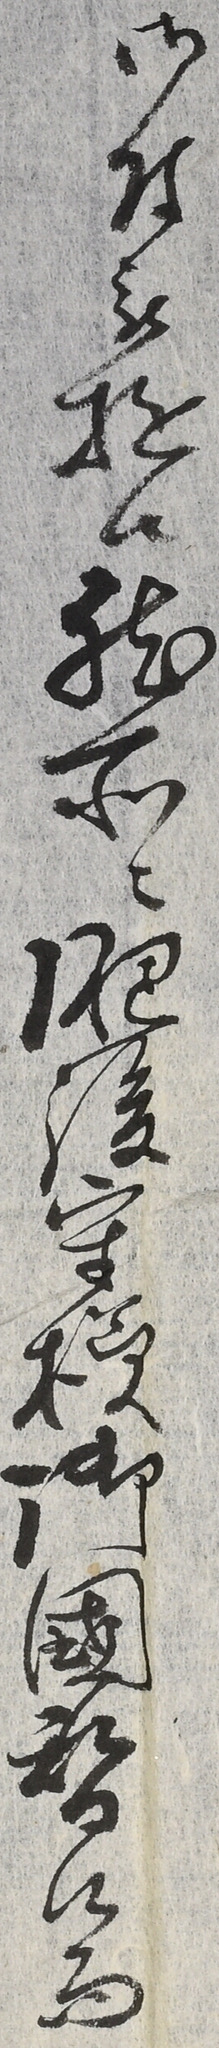御付被遊候然所ニ肥後守様御国替候而
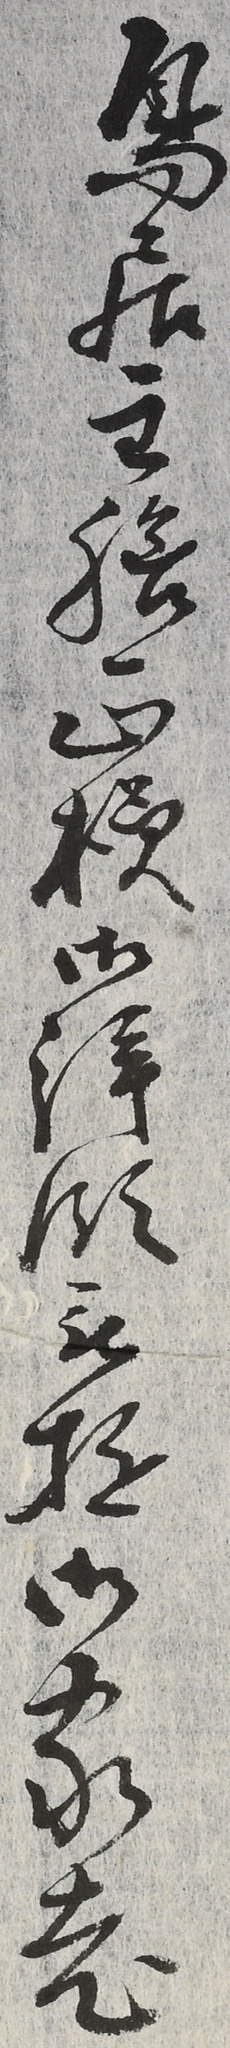鳥居主膳正様御拝領被遊御家老
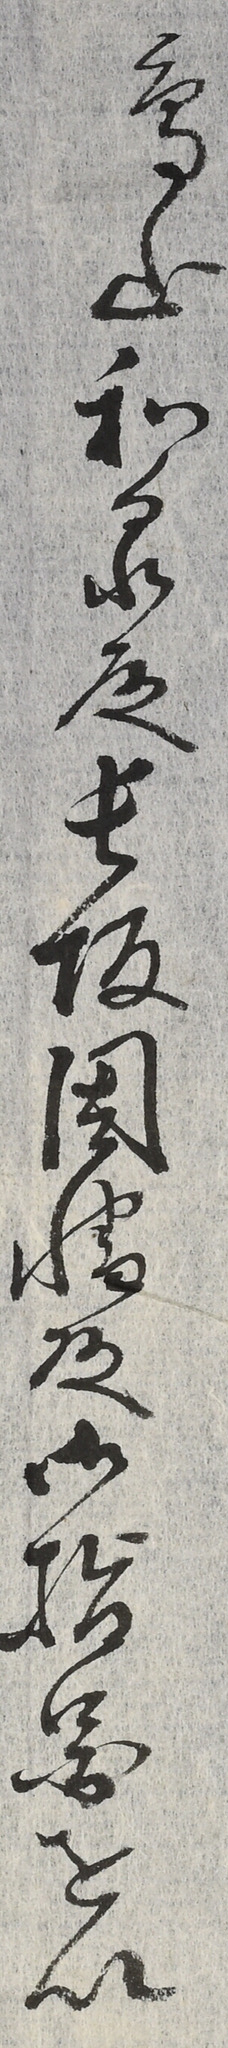鳥山和泉殿長坂因幡殿御指図を以
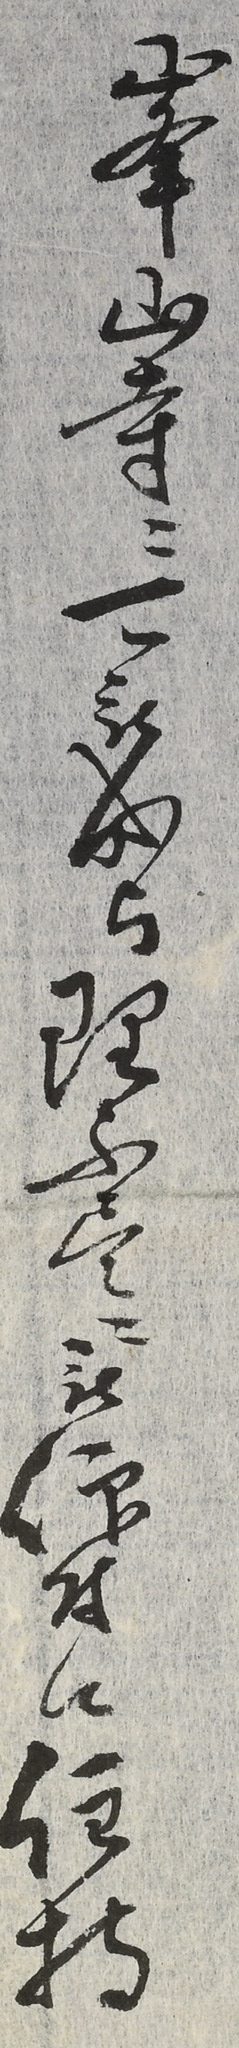峯山寺ニ可被成与理不尽ニ被仰付候住持
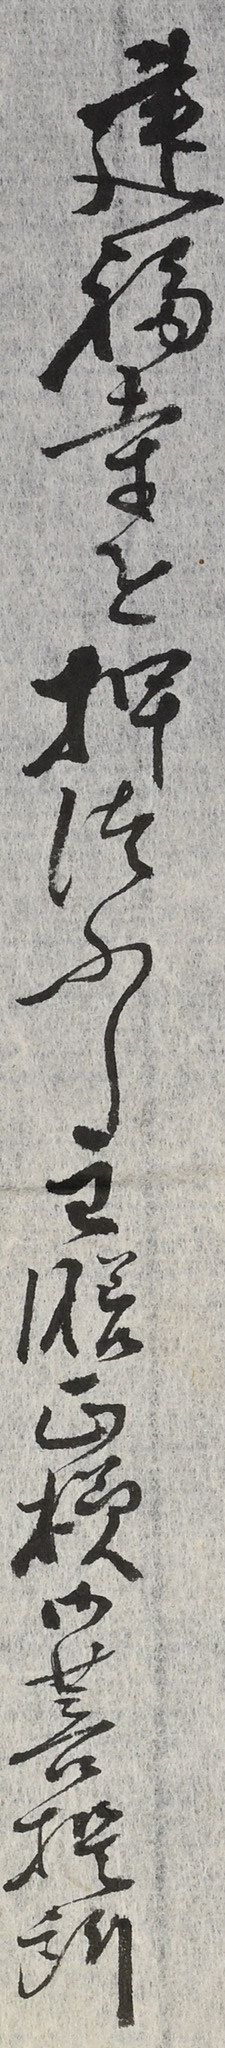建福寺を押つふし主膳正様御菩提所
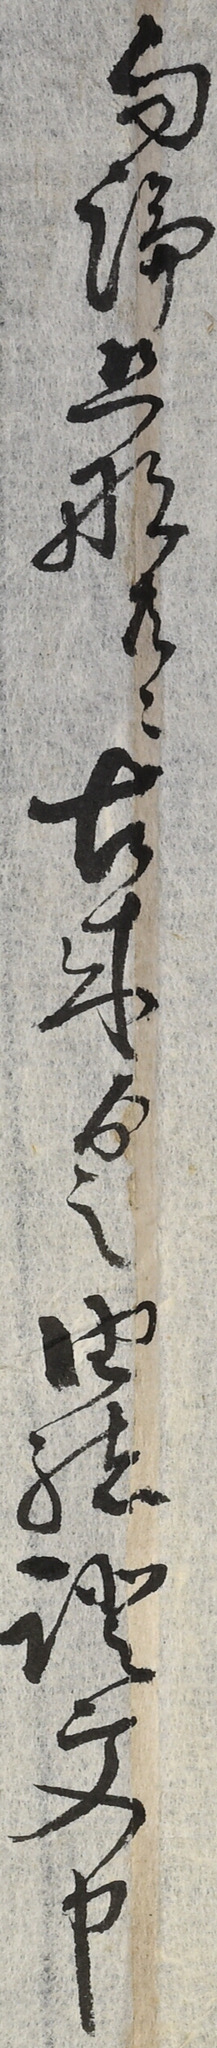勿論旦那共ニ古来ゟ之由緒証文申
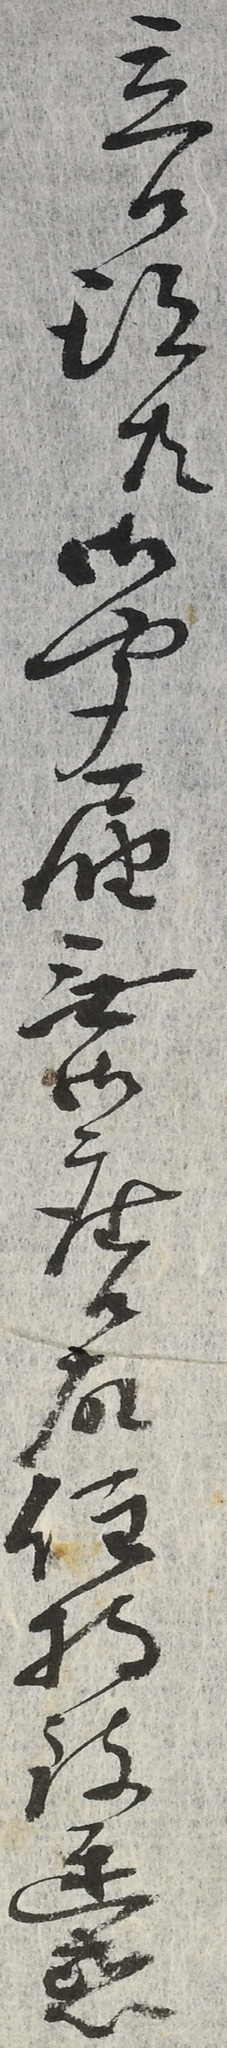立候得共御聞届無御座候故住持致迷惑
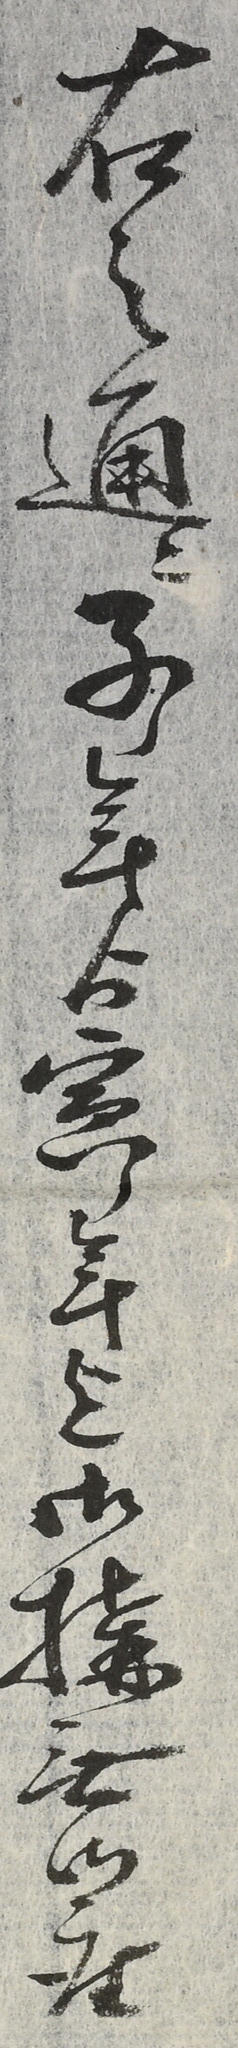右之通ニ子ノ年ゟ寅ノ年迄御構無御座
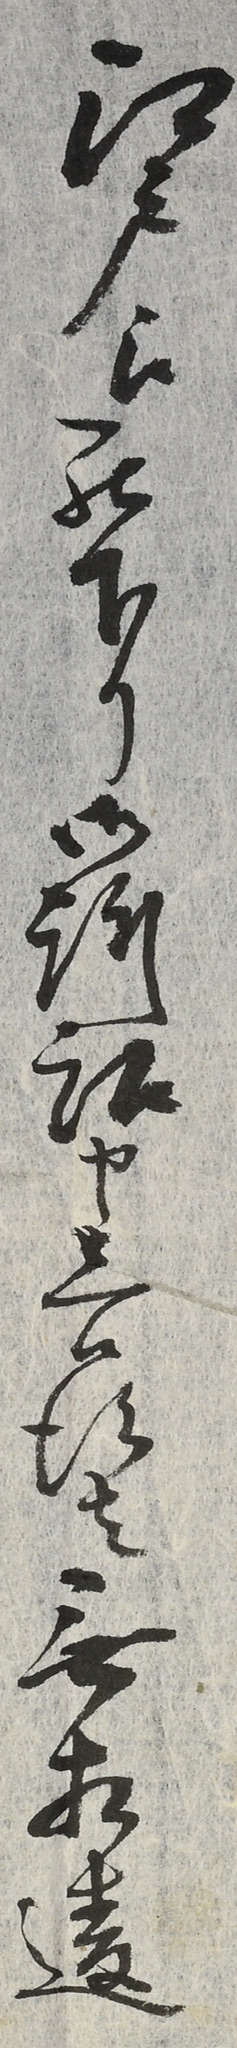江戸江罷下り御訴訟申上候得は無相違
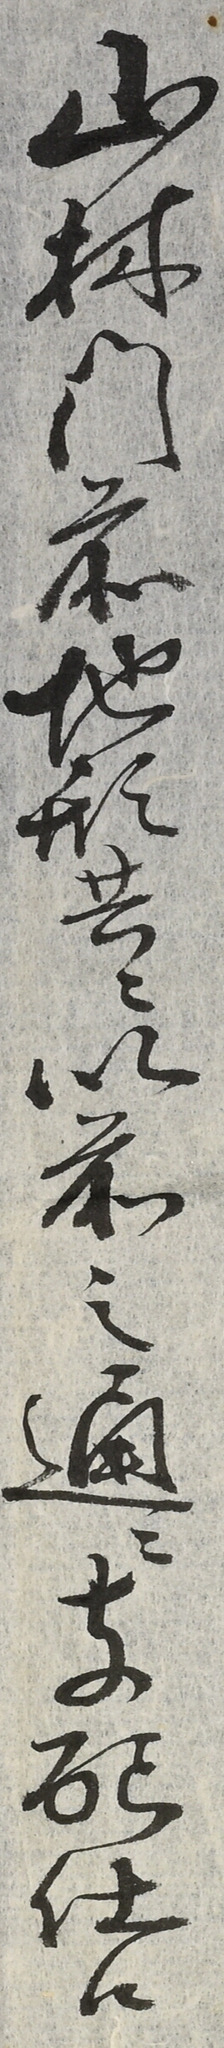山林門前地形共ニ以前之通ニ支配仕候
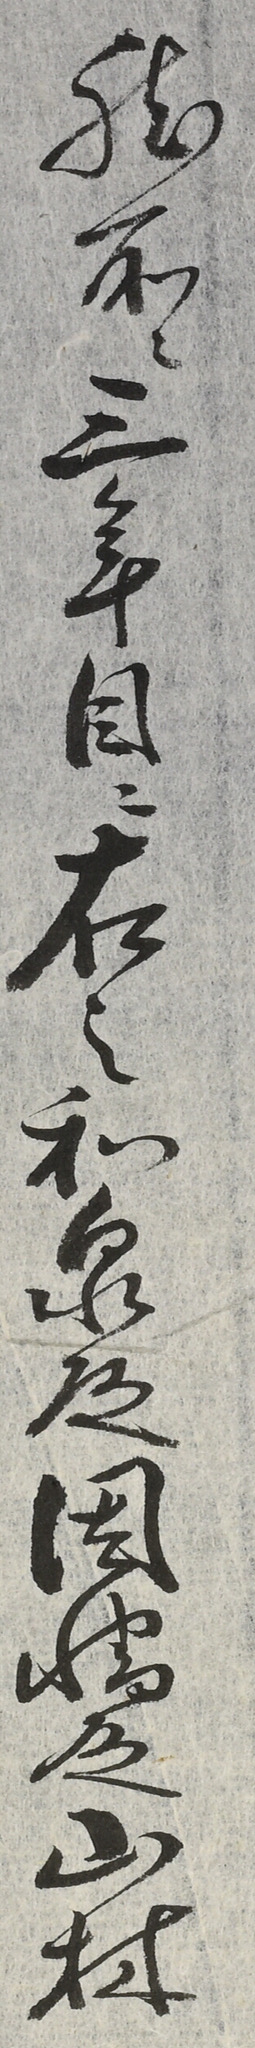然所ニ三年目ニ右之和泉殿因幡殿山林
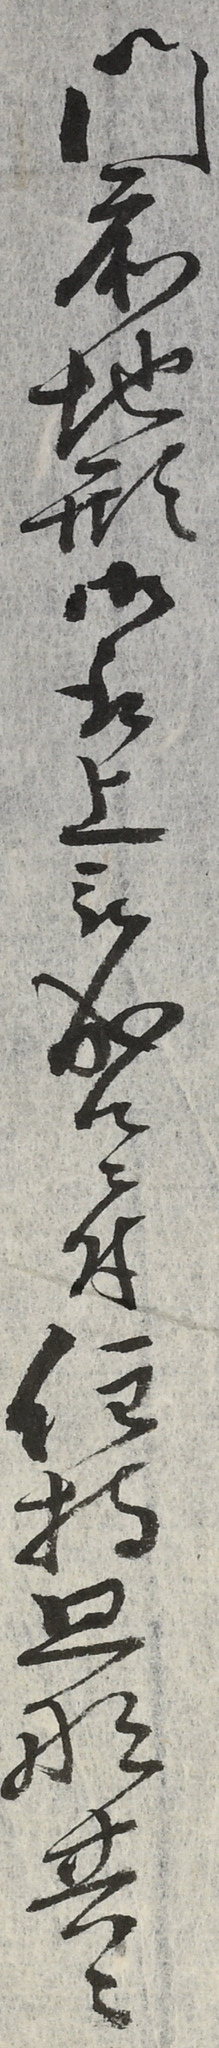門前地形御取上被成候ニ付住持旦那共々
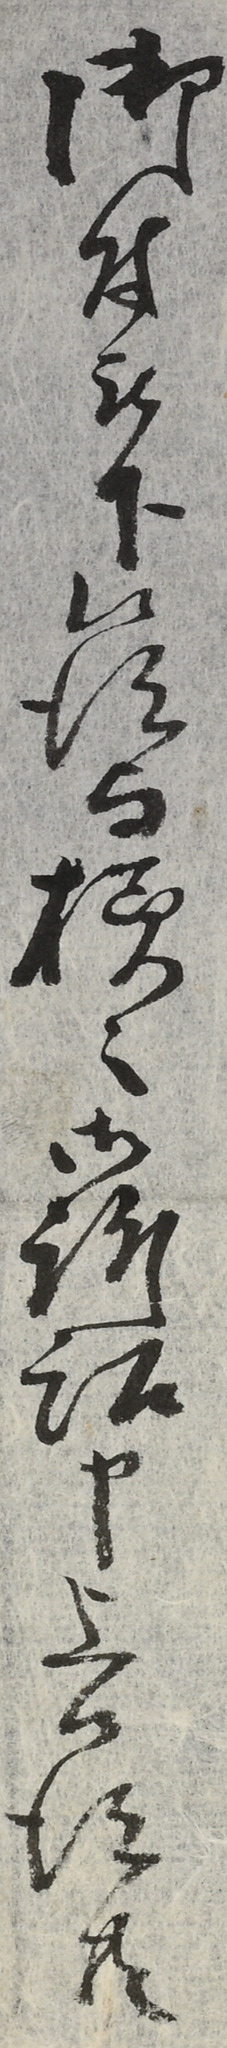御付被下候得与様々御訴訟申上候得共
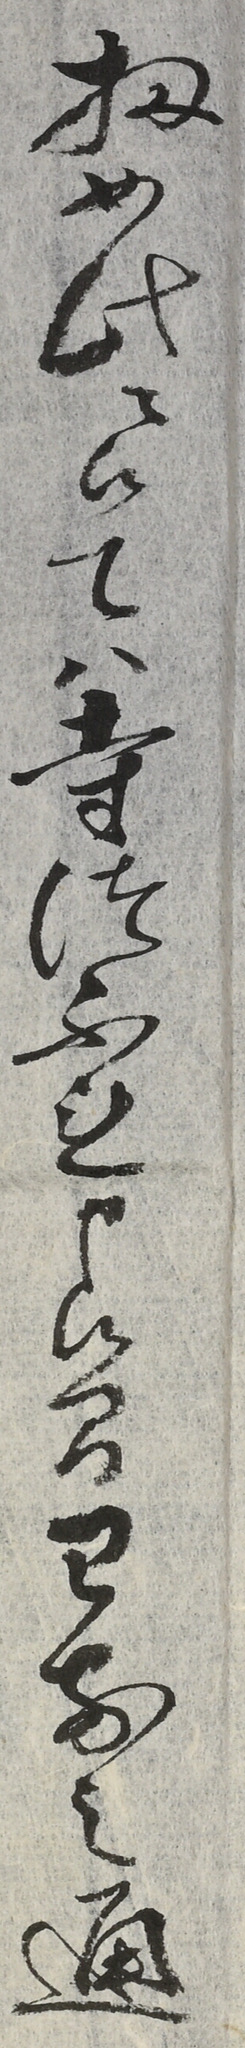扨如此ニ候てハ寺つふれ申候間已前之通
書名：旧記
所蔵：伊那市立高遠町図書館・合同会社AMANE
